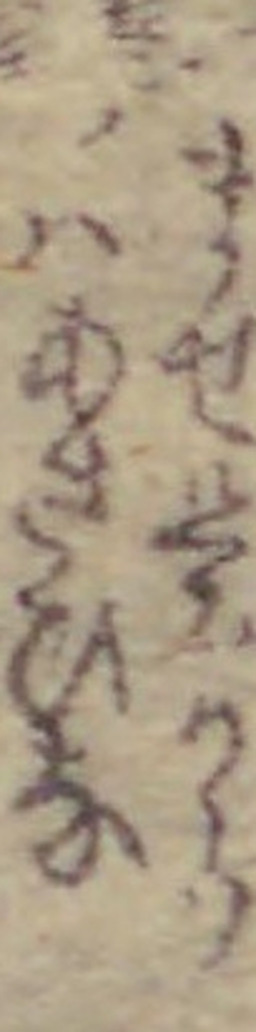はあさひな
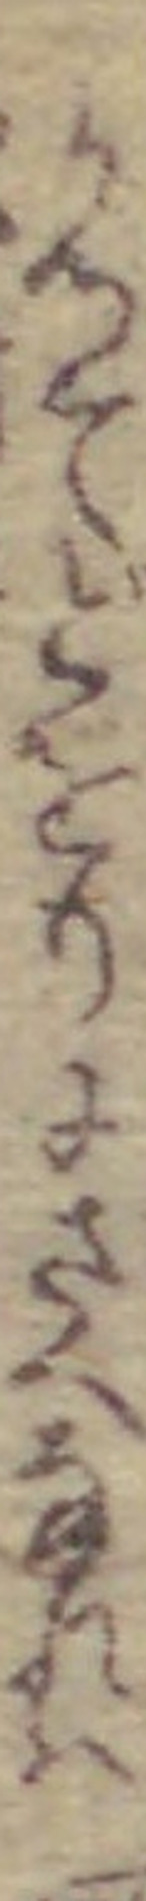かつてどをりにさへなれは
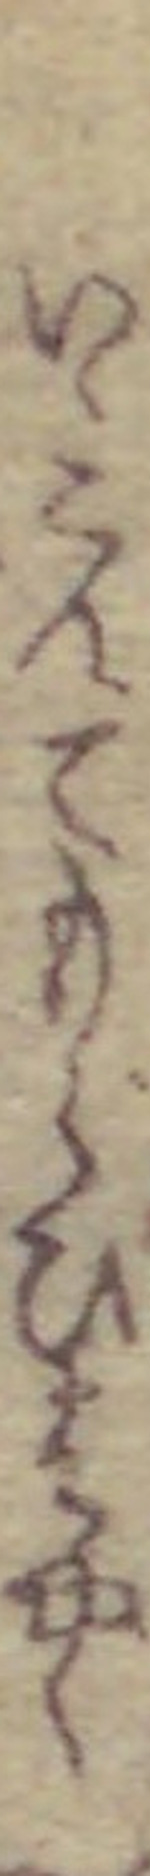いゝこんてもらひはやく
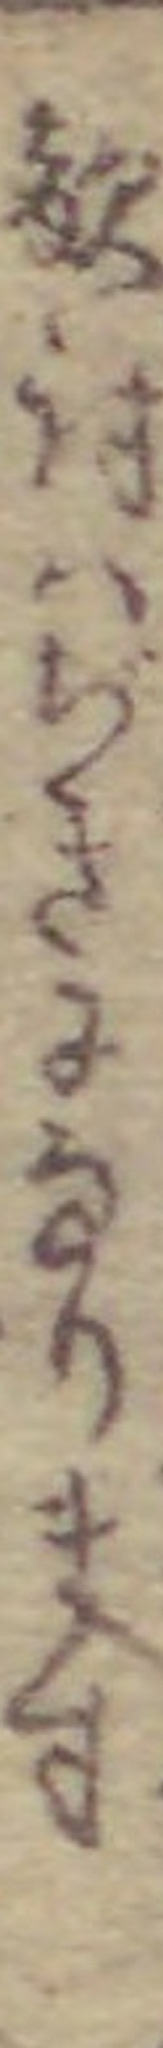敵討はぢきになります
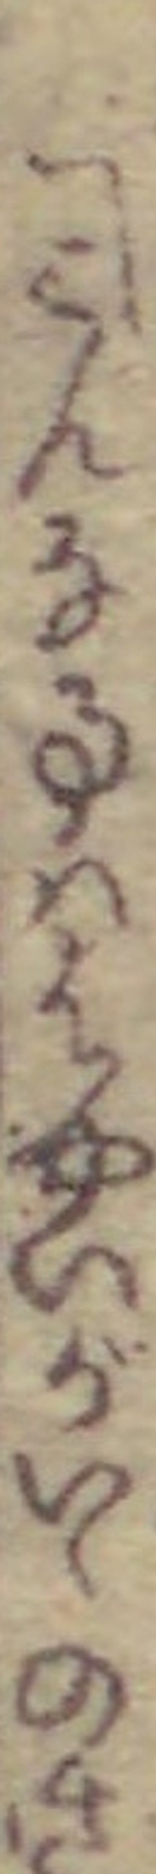「こんな事ははやいがいゝのさ

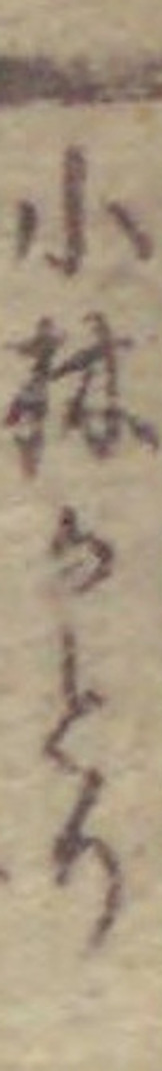小林かとり
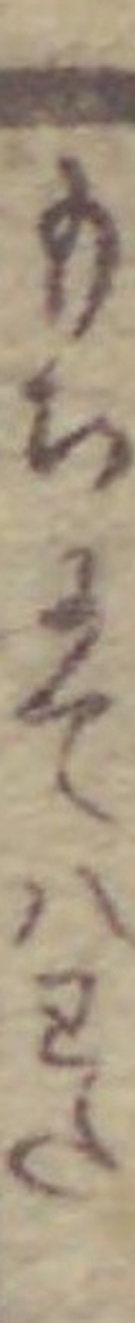もちにて八わたに
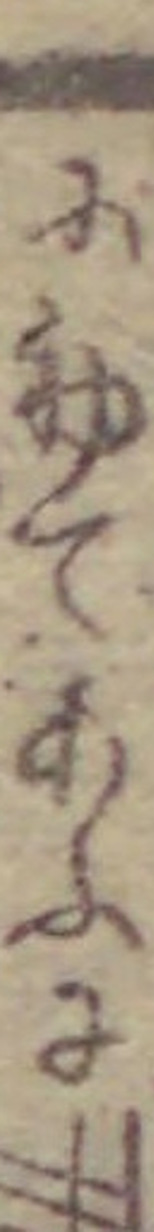初てあふに
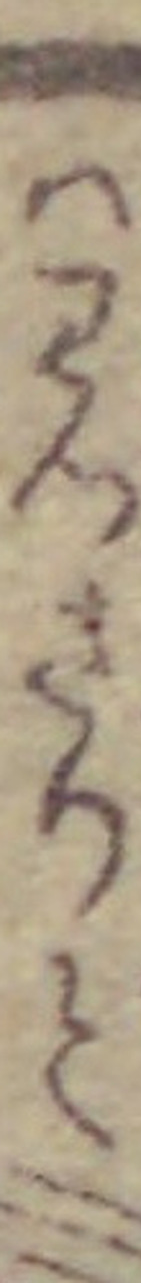はわつさりと
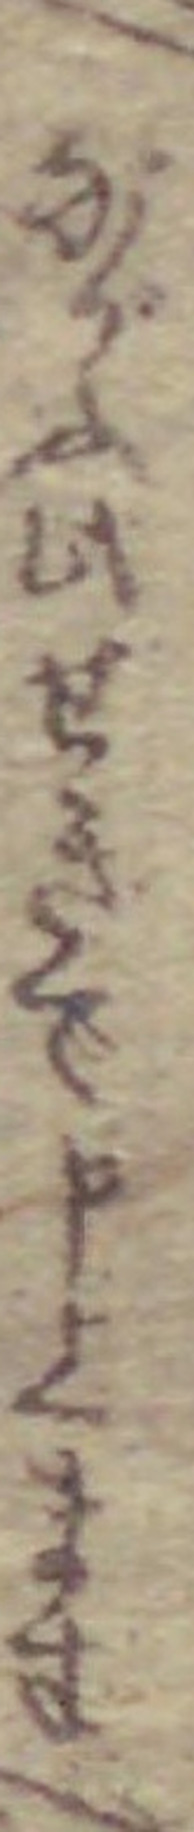ながふ此せきで申上ます
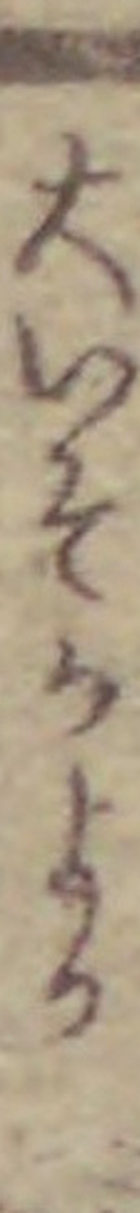大いそかよか
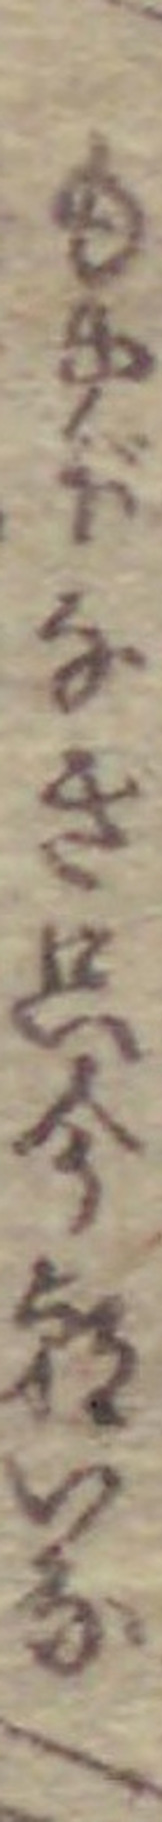もやぼなき只今朝いな
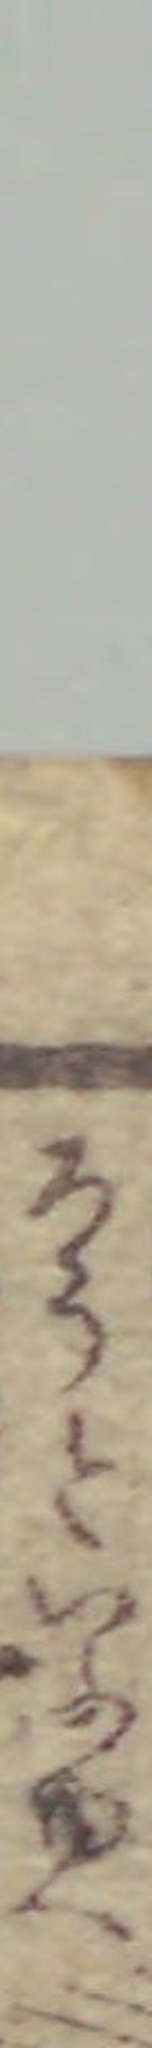ろうといふゆへ
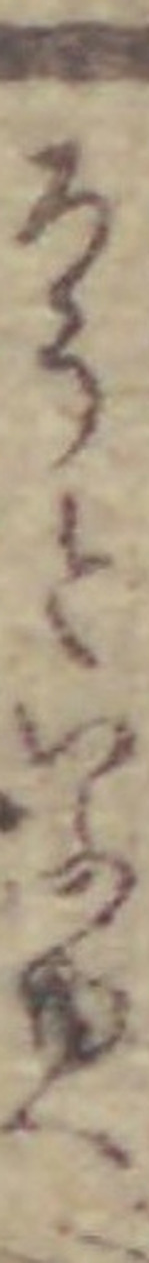ろうといふゆへ
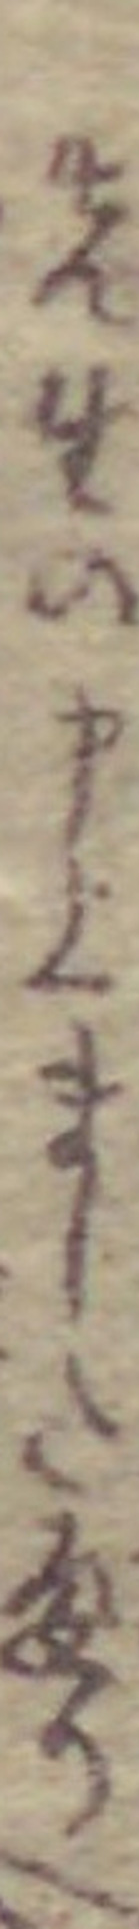先生の申上ました通り
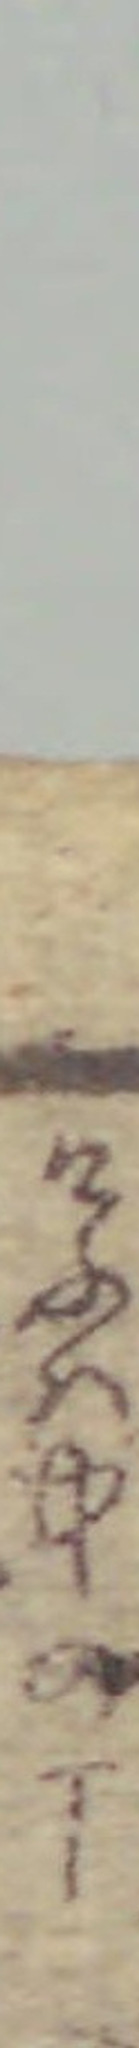けふは中の丁
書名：間似合嘘言曽我 3巻
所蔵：国立国会図書館 National Diet Library, JAPAN
